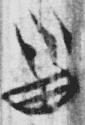○（畎）
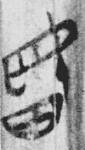○（畝）
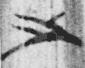之
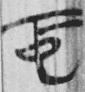𠁩
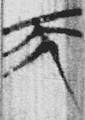而
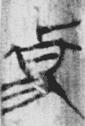史（使）
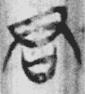君
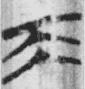天
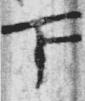下
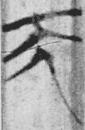而
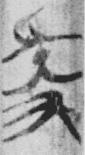爯（稱）
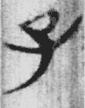子
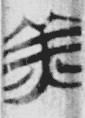羔
